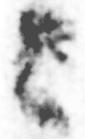馬
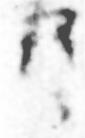尹
